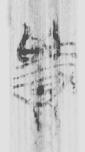{爲貝}
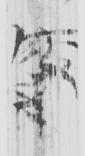{殷邑}
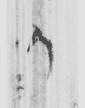人
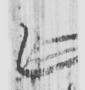戶
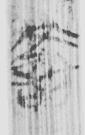罰
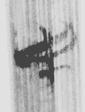民
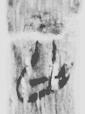㠯（以）
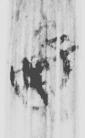好
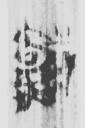{暴戈}
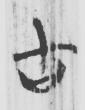古
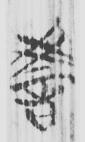{爻言}
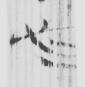必
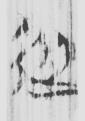從
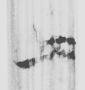上
